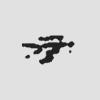不
